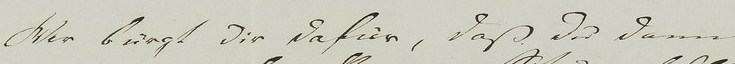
Wer bürgt Dir dafür, daß Du dann
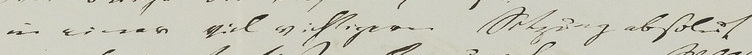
in einer viel wichtigern Sitzung absolut
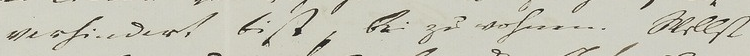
verhindert bist, bei zu wohnen. Willst
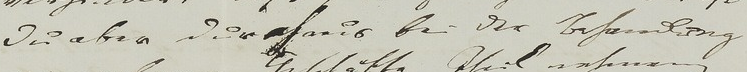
Du aber durchaus bei der Behandlung
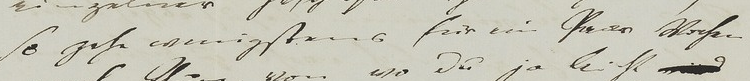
so gehe wenigstens für ein Paar Wochen
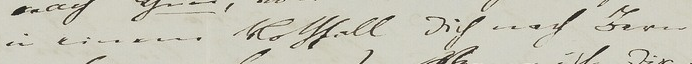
in einem Nothfall Dich nach Bern
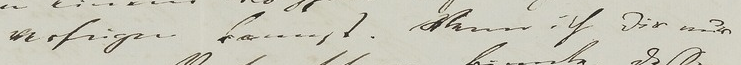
verfügen kannst. Wenn ich Dir nur
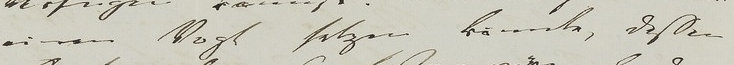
einen Vogt setzen könnte, dessen
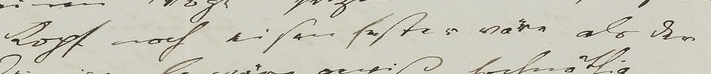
Kopf noch eisenfester wäre als der
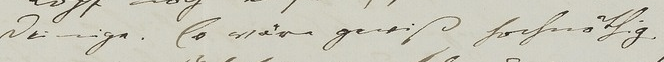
Deinige. Es wäre gewiß hochnöthig.
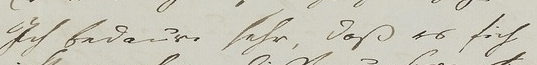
Ich bedaure sehr, daß es sich
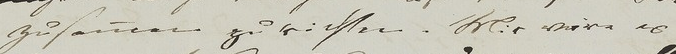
zusammen zu richten. Mir wäre es
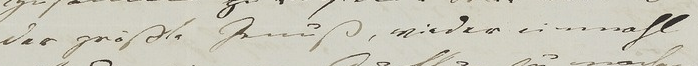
der größte Genuß, wieder einmahl
